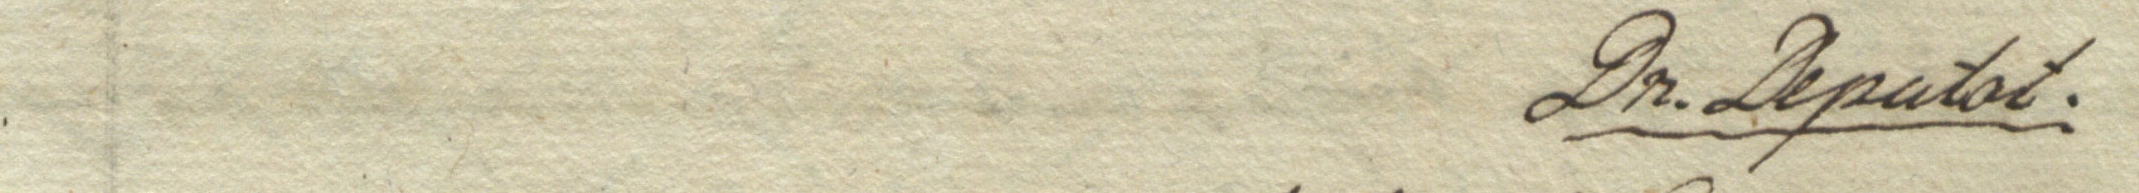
Dn. Deputat.
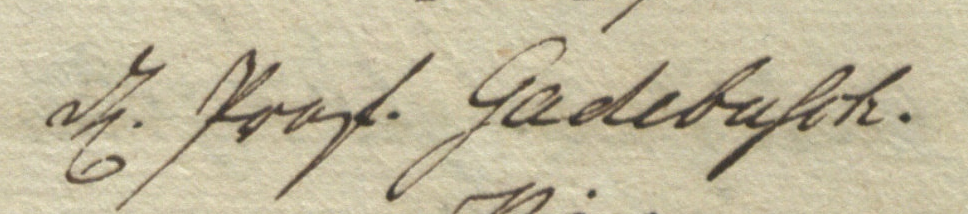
dh. Prof. Gadebusch.
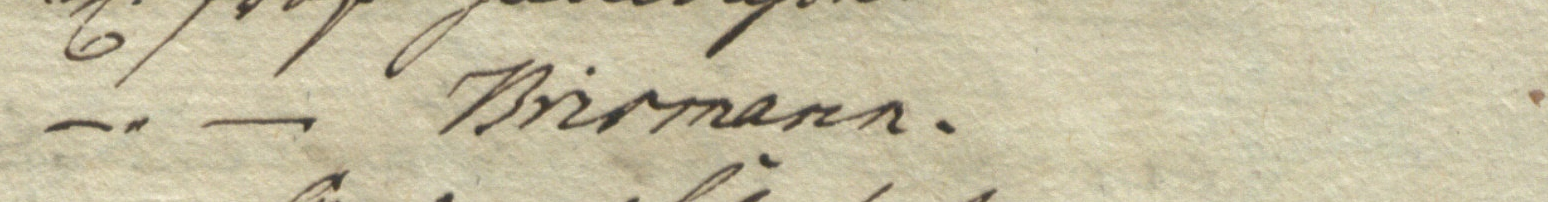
- " - Brismann.
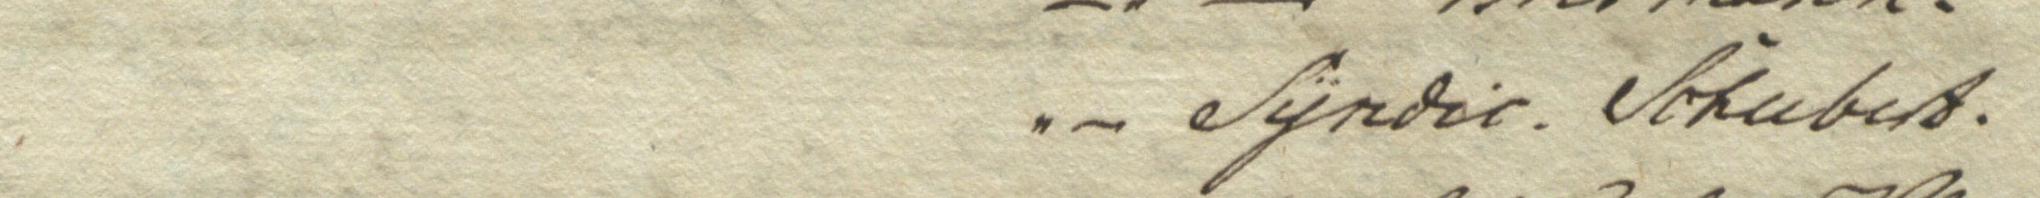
" - Syndic. Schubert.
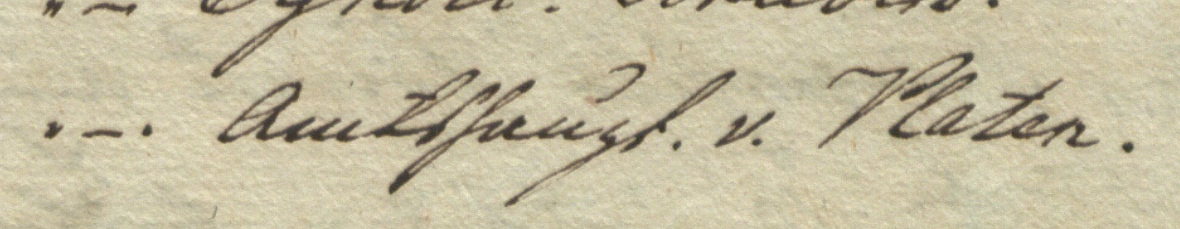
" - " Amtshaupt. v. Platen.
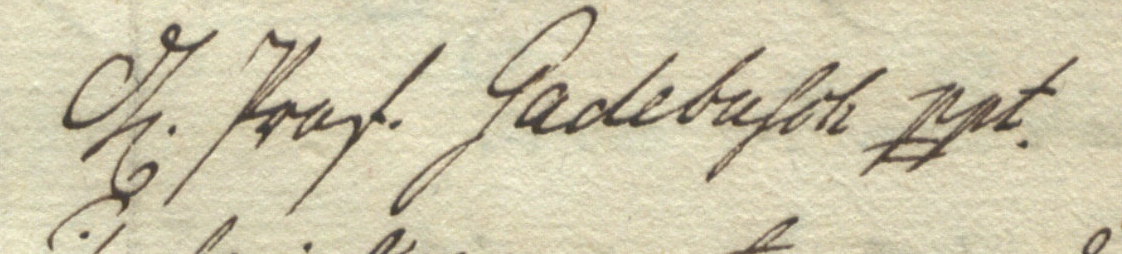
dh. Prof. Gadebusch ppt.
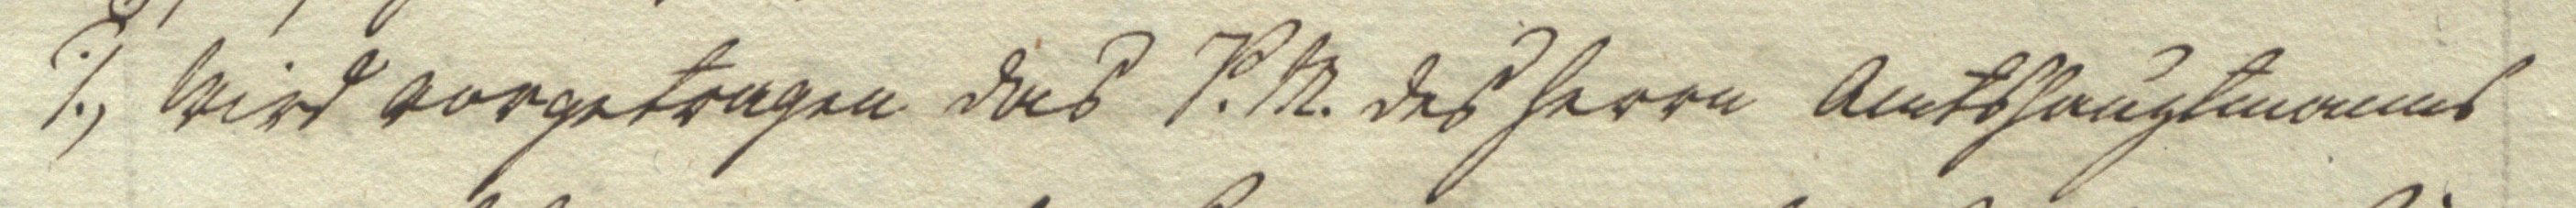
1., Wird vorgetragen das P. M. des Herrn Amtshauptmanns
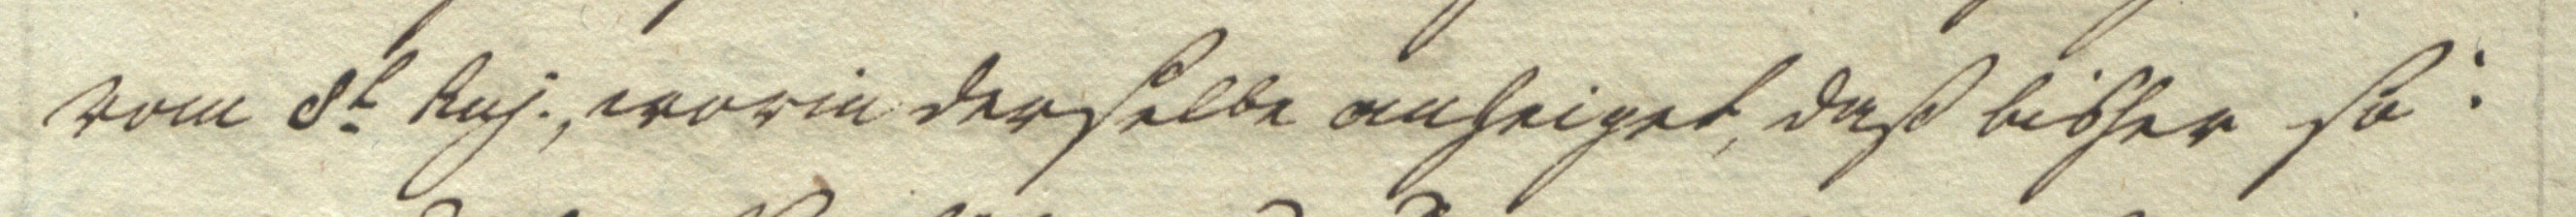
vom 8t. huj., worin derselbe anzeiget, daß bisher so¬
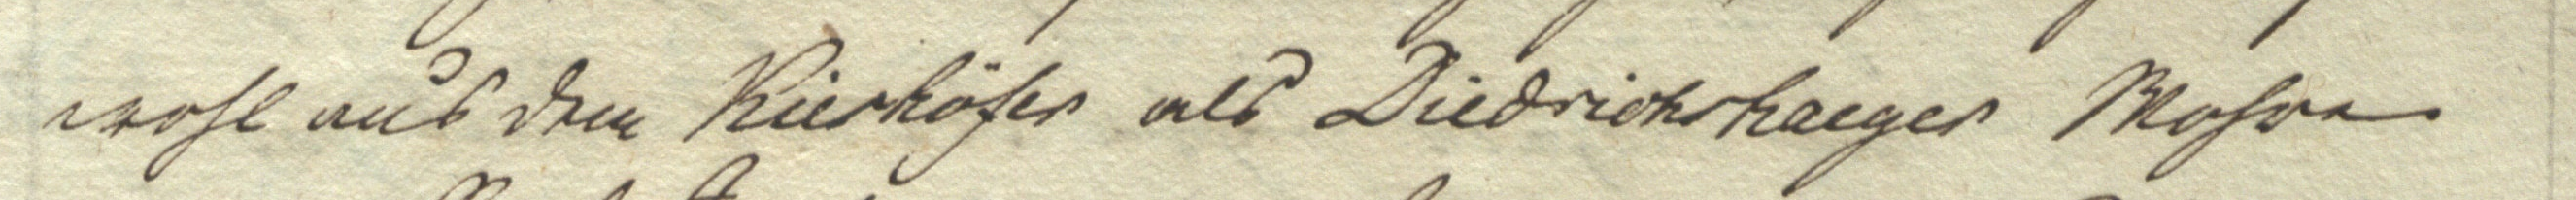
wohl aus dem Kieshöfer als Diedrichshaeger Mohren
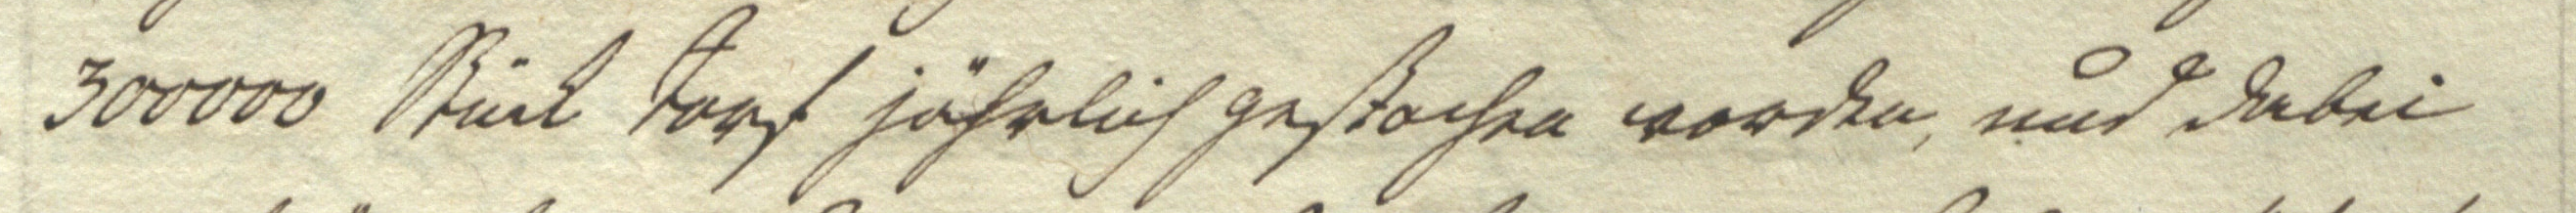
300000 Stück Torf jährlich gestochen worden, und dabei
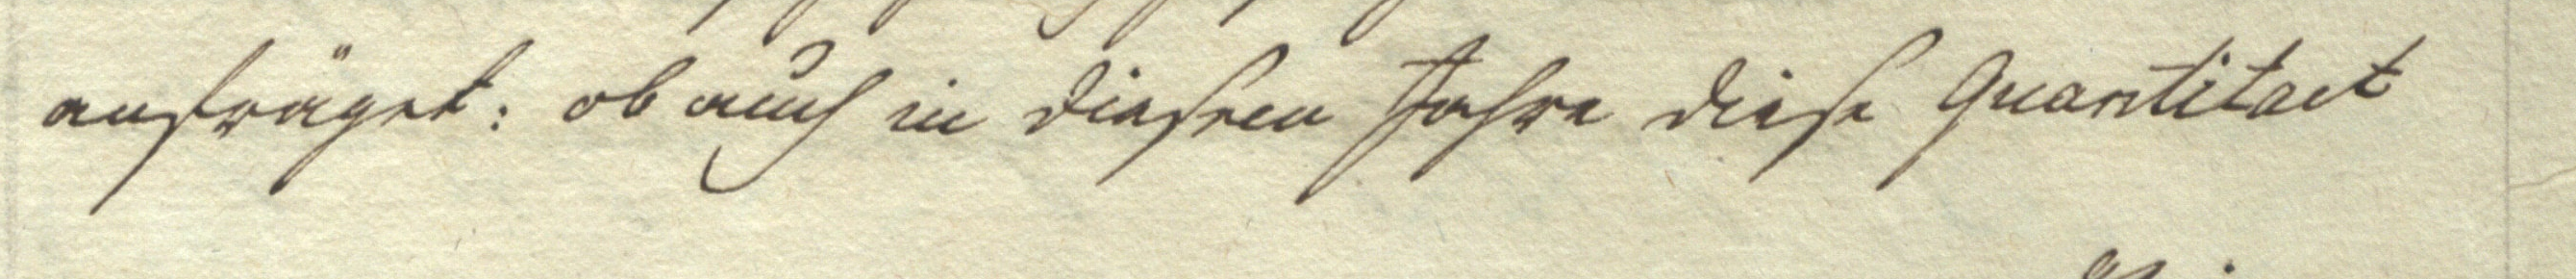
anfräget: ob auch in diesem Jahre diese quantitaet
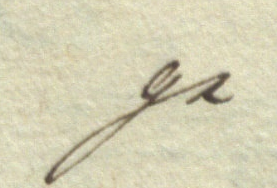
ge¬
